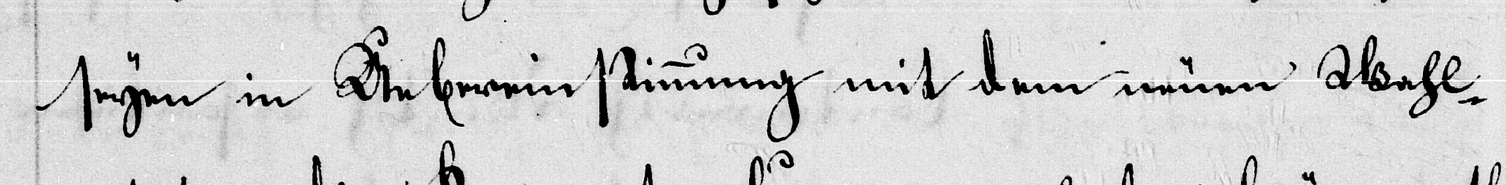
seyen in Uebereinstimmung mit dem neuen Wahl¬
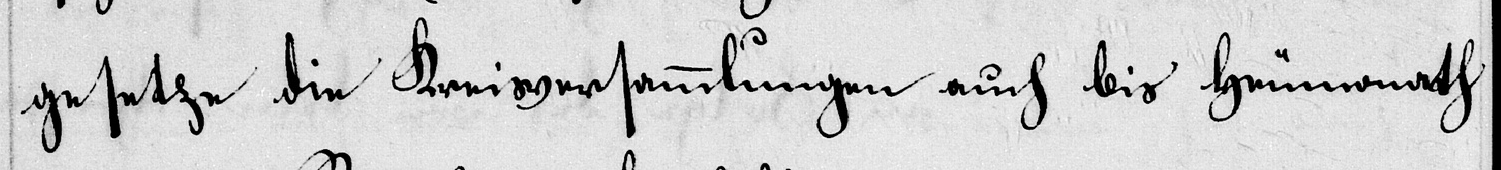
gesetze die Kreisversammlungen auch bis Heumonath
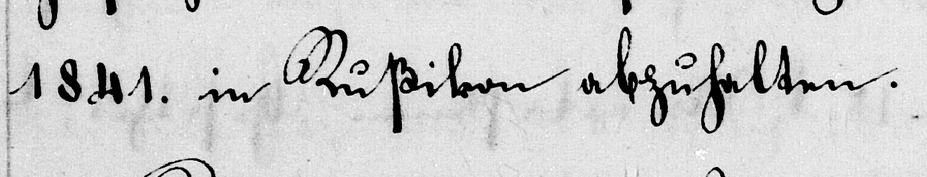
1841. in Rußikon abzuhalten.
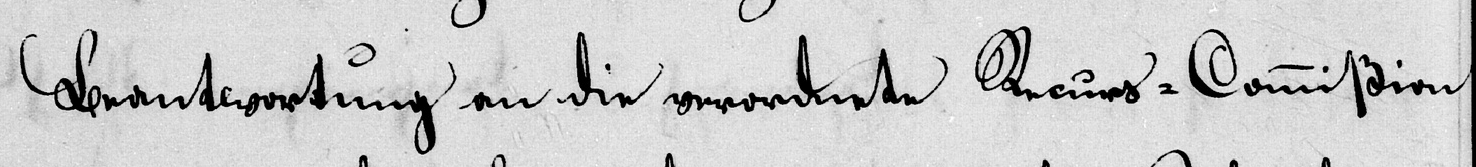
Beantwortung an die verordnete Recurs-Commißion
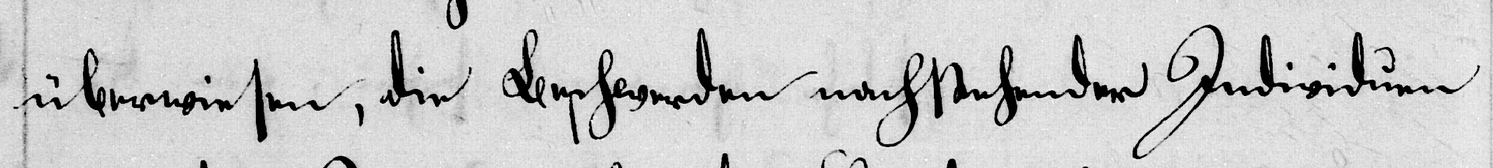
überwiesen, die Beschwerden nachstehender Individuen
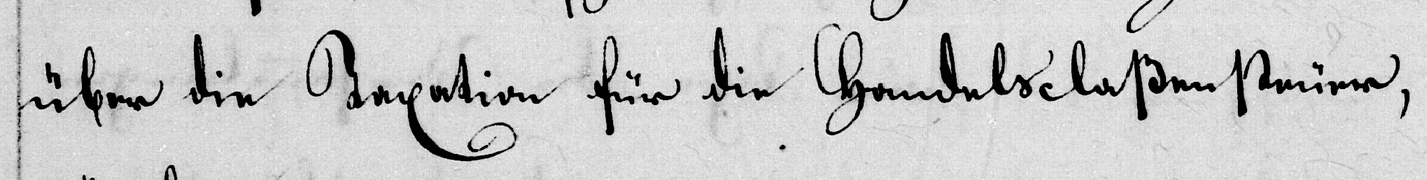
über die Taxation für die Handelsclaßensteuer,
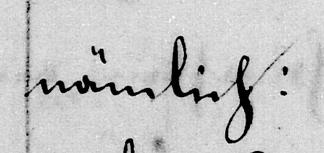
nämlich:
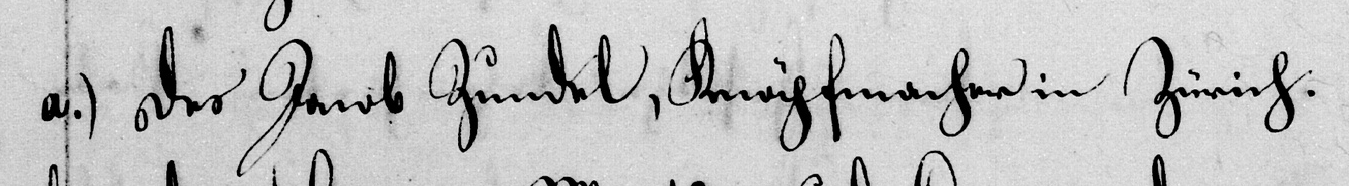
a.) Des Jacob Zundel, Knöpfmacher in Zürich.
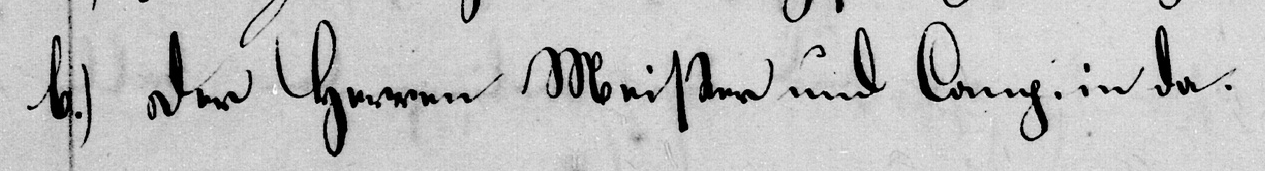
b.) Der Herren Meister und Comp. in da.
